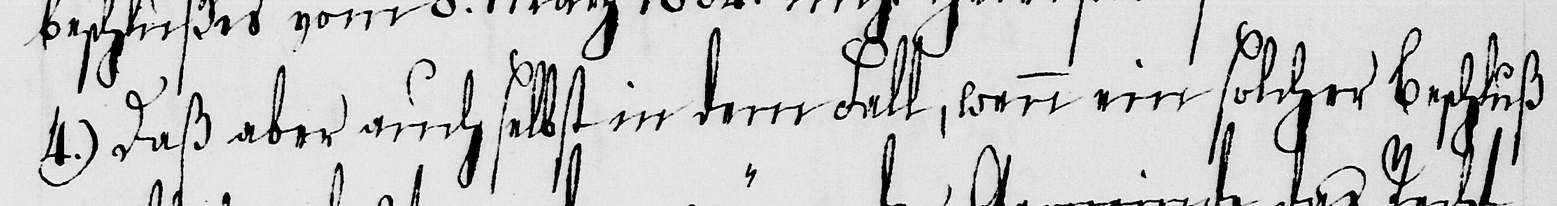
4.) Daß aber auch selbst in dem Fall, wenn ein solcher Beschluß
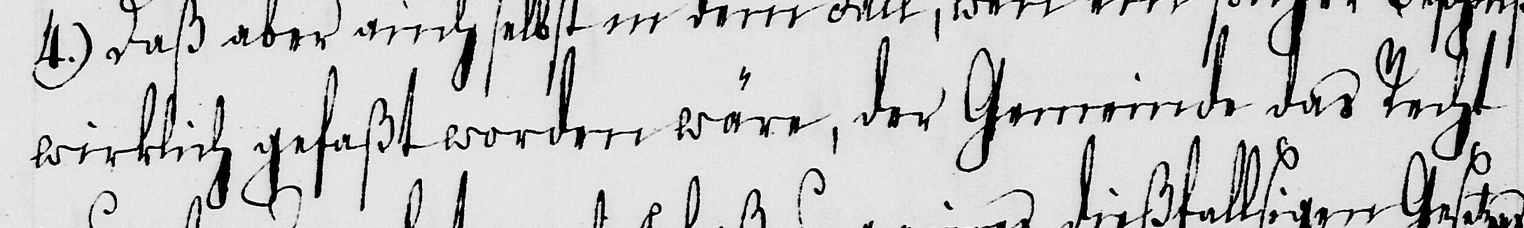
wirklich gefaßt worden wäre, der Gemeinde das Recht
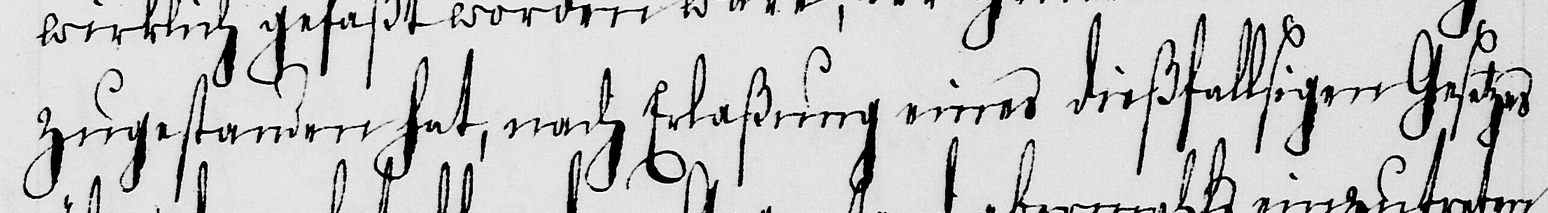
zugestanden hat, nach Erlaßung eines dießfallsigen Geset¬
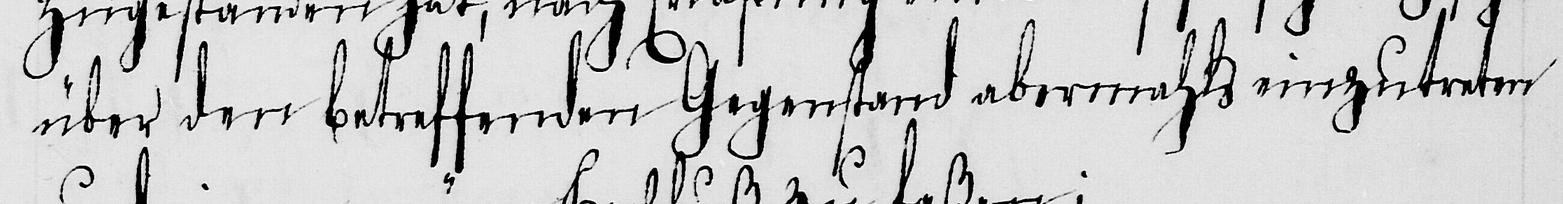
über den betreffenden Gegenstand abermahls einzutreten
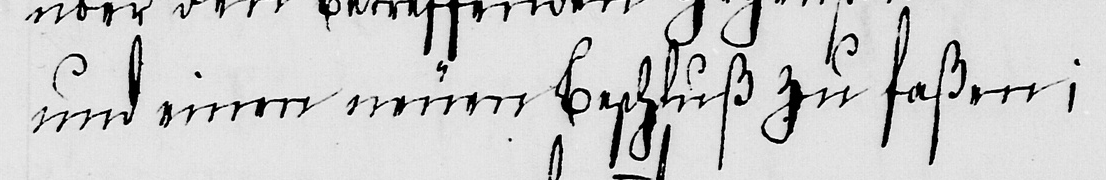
und einen neuen Beschluß zu faßen;
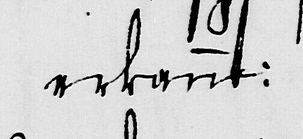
erkannt:
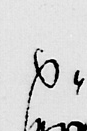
2.)
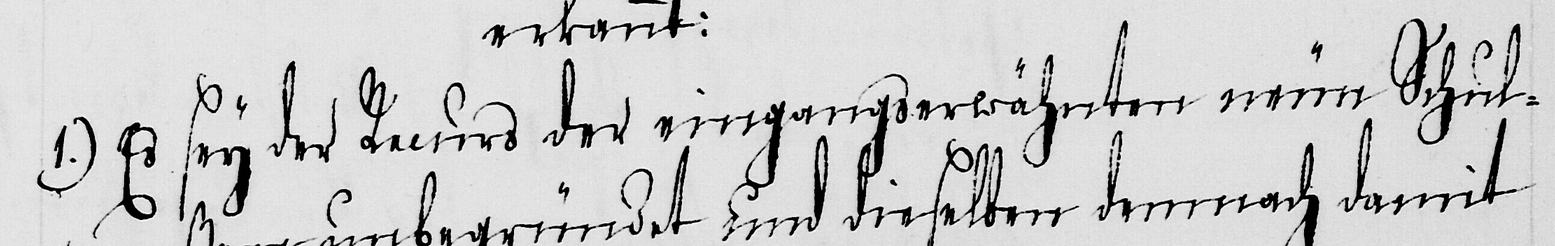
1.) Es sey der Recurs der eingangserwähnten neun Schul¬
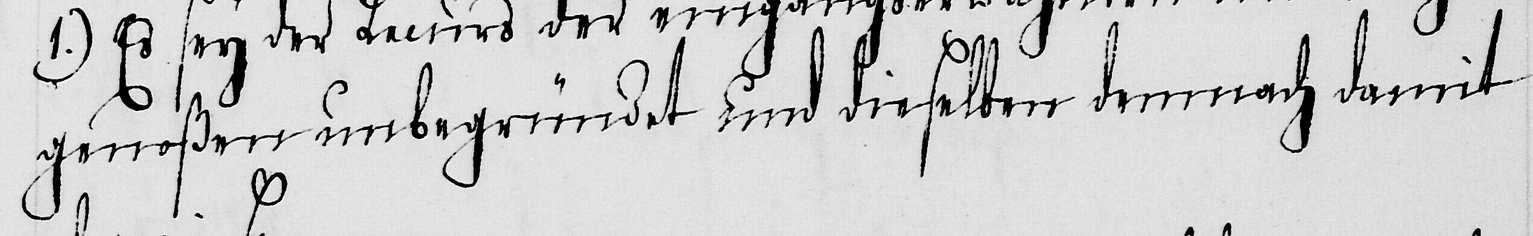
genoßen unbegründet und dieselben demnach damit
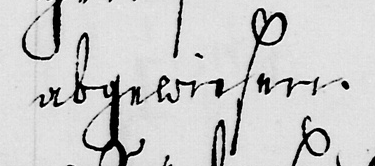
abgewiesen.
